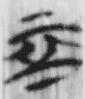亞
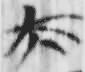夫
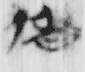俈
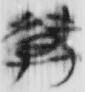登
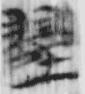輕
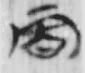丙
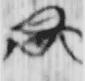晨
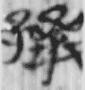○（襄）
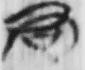君
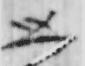之
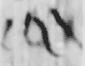州
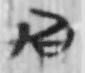加
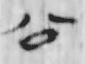公
